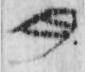月
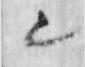乙
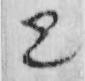巳
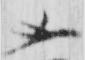之
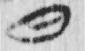日
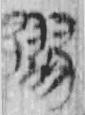鄝
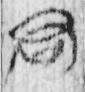君
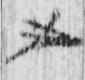之
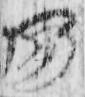泉
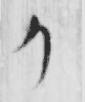人
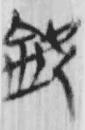欽
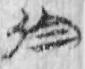於
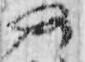君
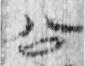公
